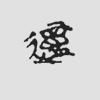{辶童}
